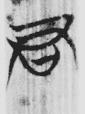君
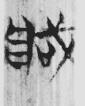戕
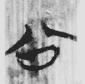公
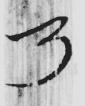乃
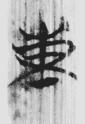東
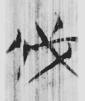伐
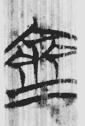齊
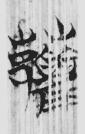{艸雚邑}
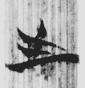之
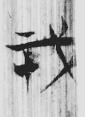戎
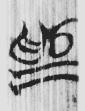爲
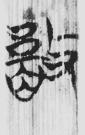{育攴}
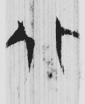北
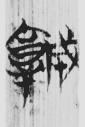{享成}
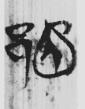{邑龴口人}
